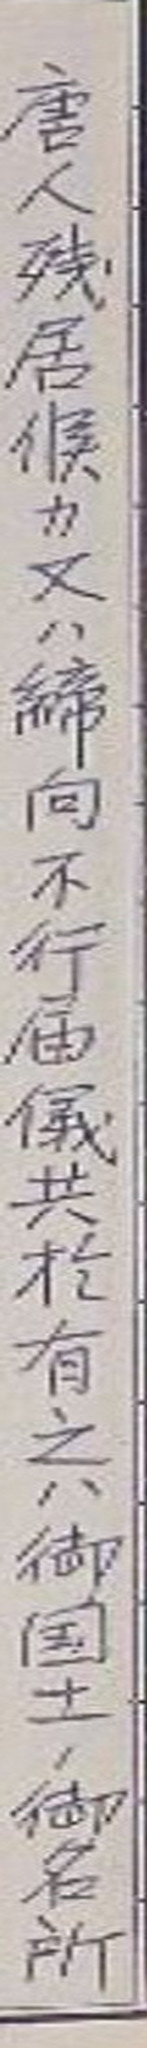唐人残居候か又は締向不行届儀共於有之は御国土の御名所
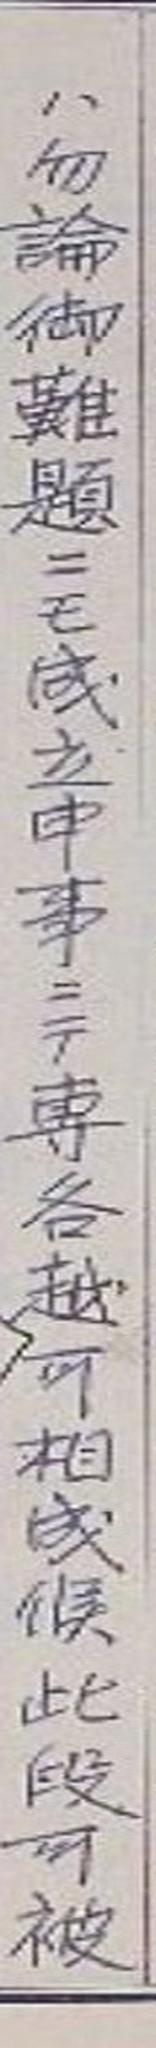は勿論御難題にも成立申事にて専各越度可相成候此段可被
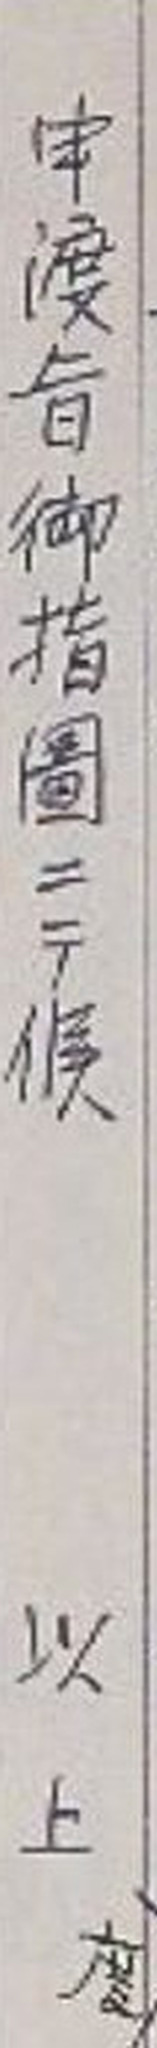申渡旨御指図にて候以上
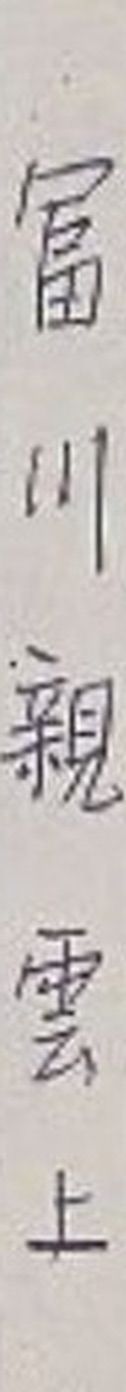古堅親雲上
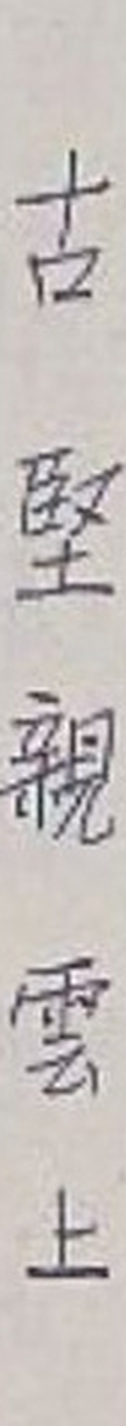古堅親雲上
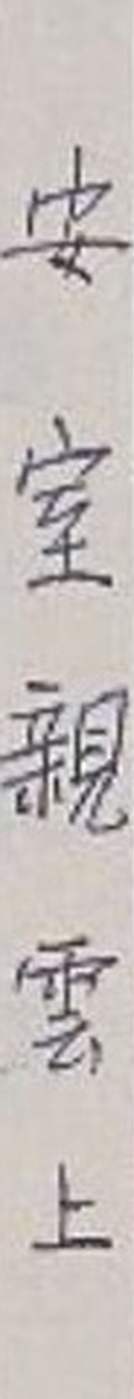安室親雲上
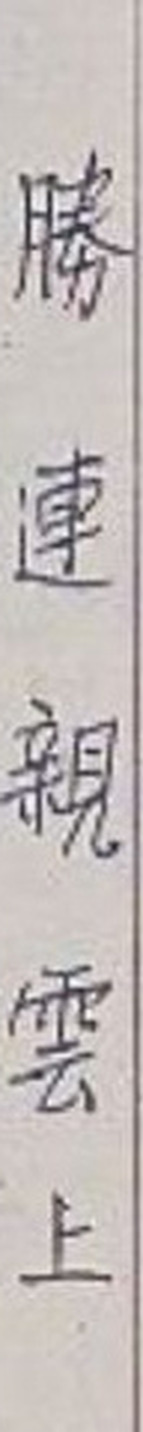勝連親雲上
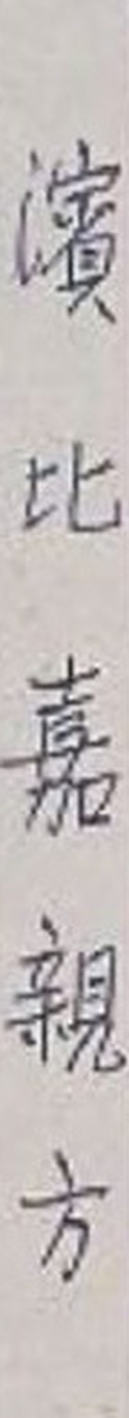浜比嘉親方
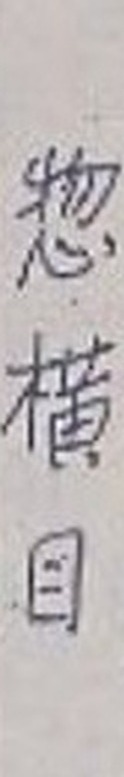惣横目
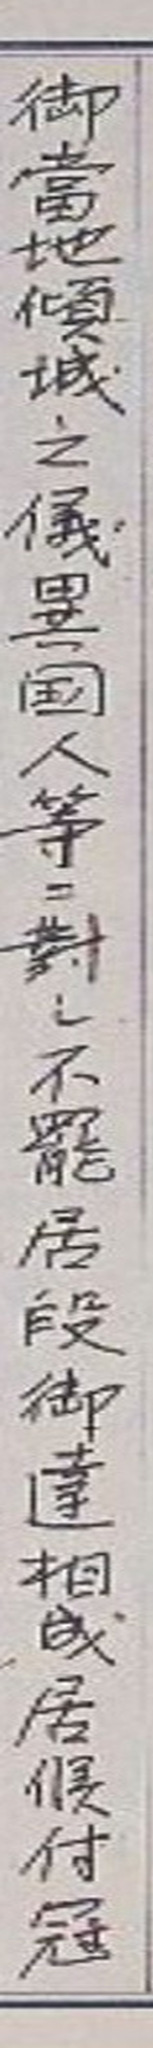御当地傾城之儀異国人等に対し不罷居段御達相成居候付冠
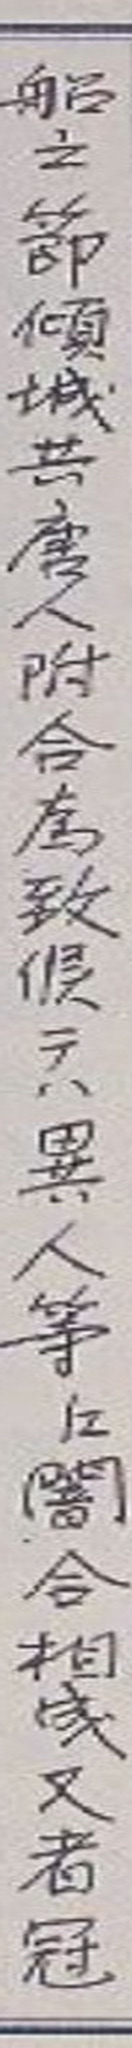船之節傾城共唐人附合為致候ては異人等え闇合相成又者冠
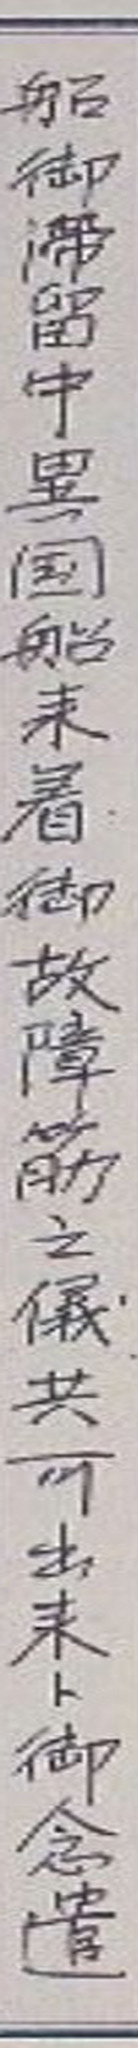船御滞留中異国船来着御故障筋之儀共可出来と御念遣
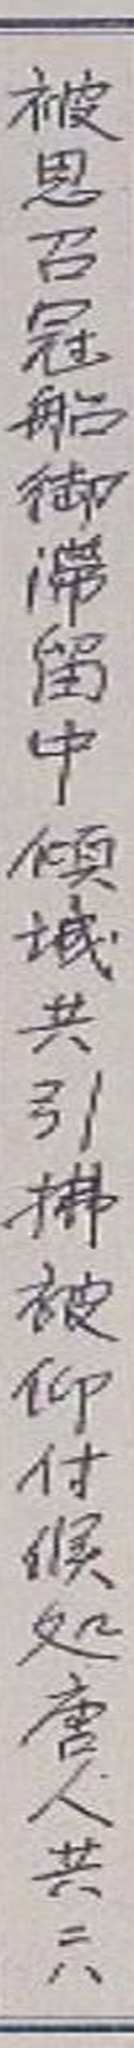被思召冠船御滞留中傾城共引払被仰付候処唐人共には

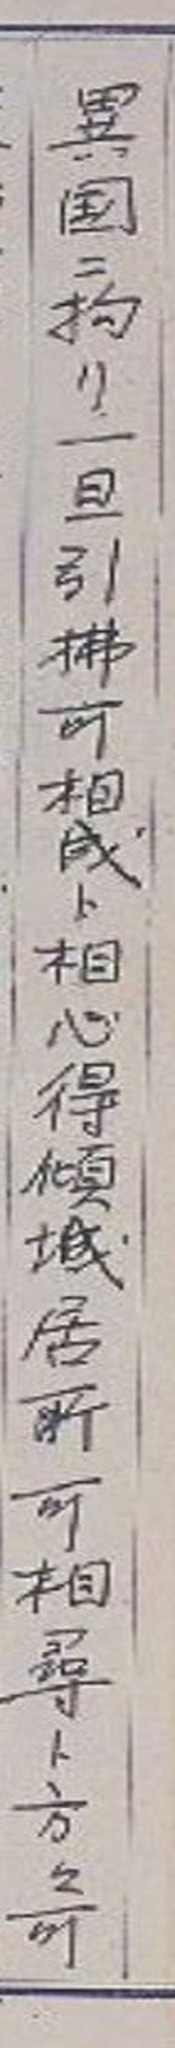異国に拘り一旦引払可相成と相心得傾城居所可相尋と方々可
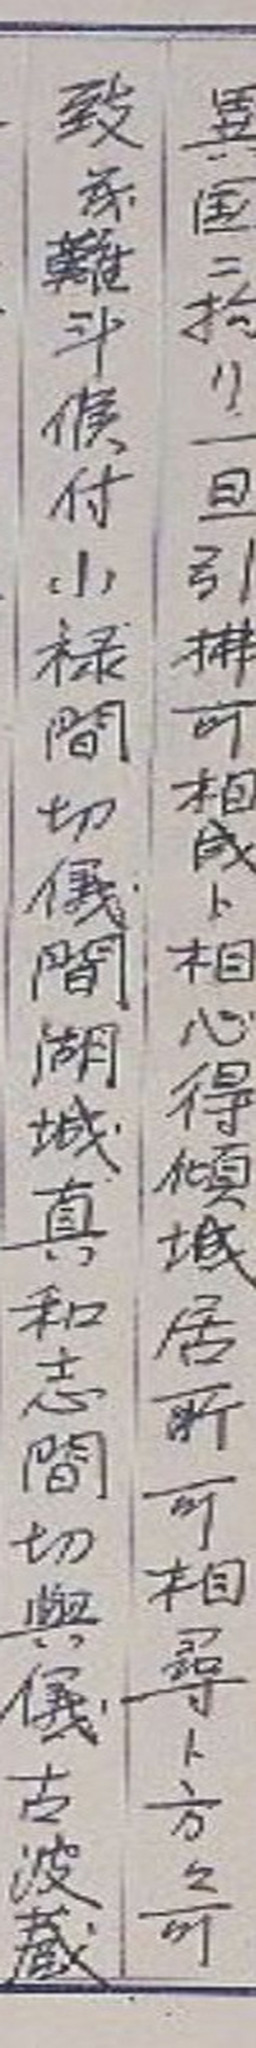致も難計候付小禄間切儀間湖城真和志間切与儀古波蔵
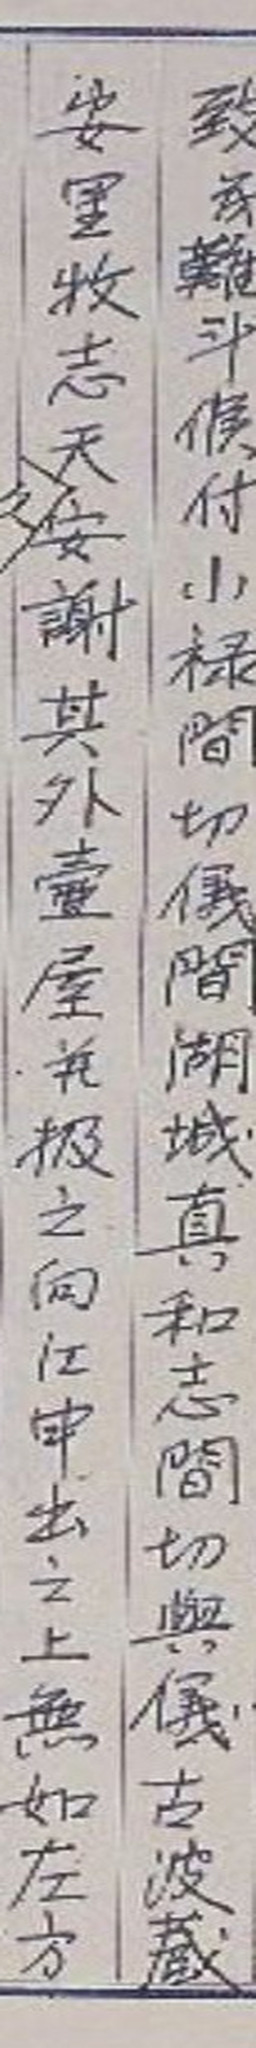安里牧志天久安謝其外壺屋并扱之向え申出之上無如左方
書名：支那冊封使来琉諸記 下巻
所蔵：University of the Ryukyus Library
